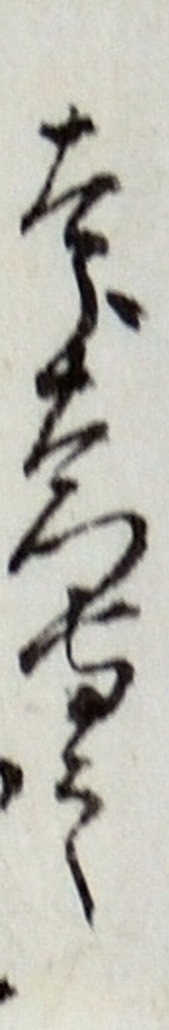太郎右衛門守之
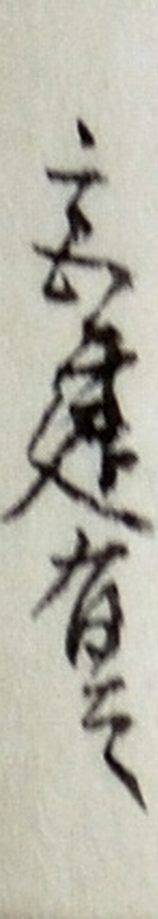宮建有之
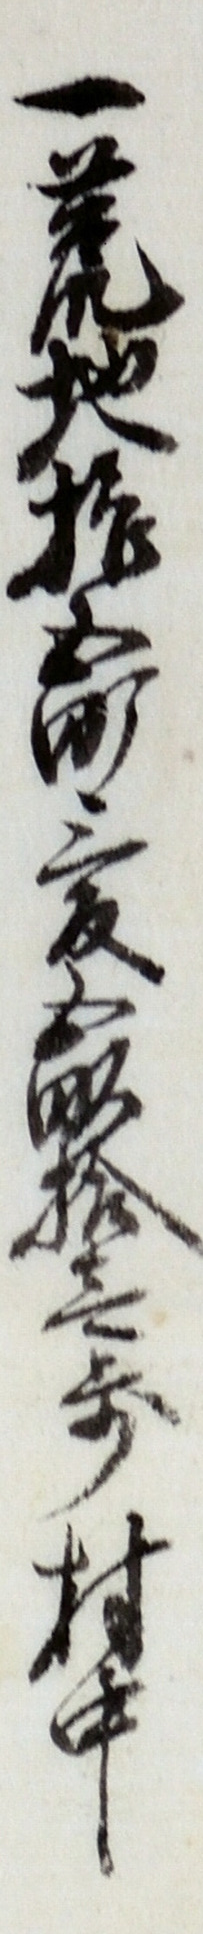一荒地拾五町三反五畝拾七歩村中
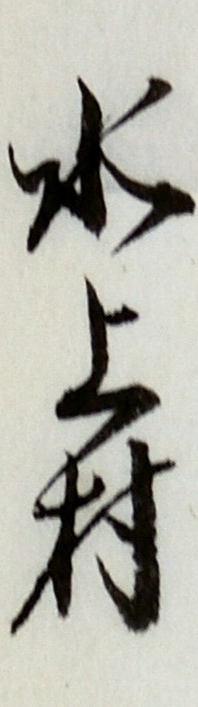水上村
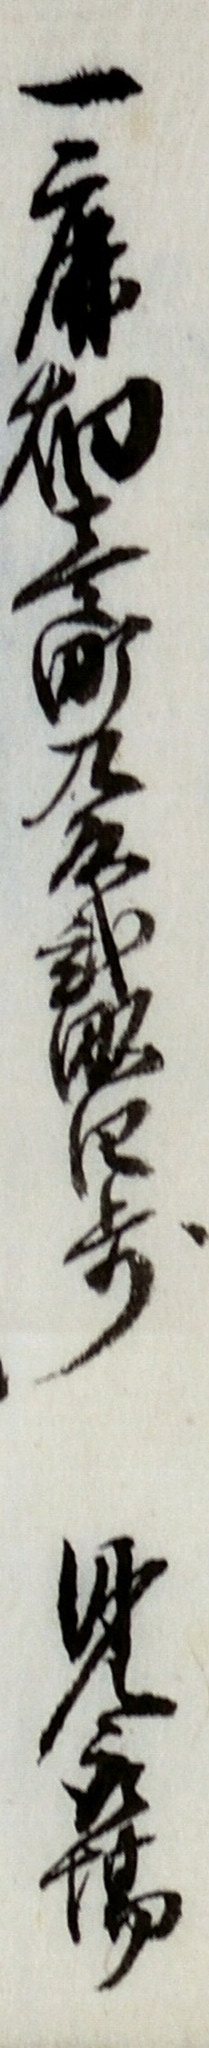一麻畑壱町九反弐畝四歩見取場
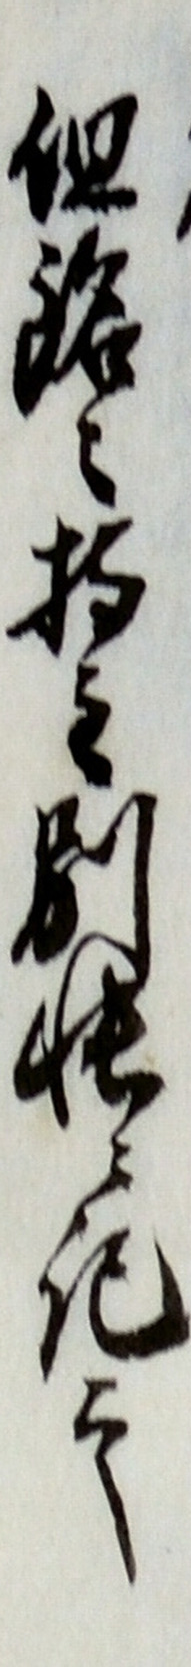但銘々持主別帳ニ記之
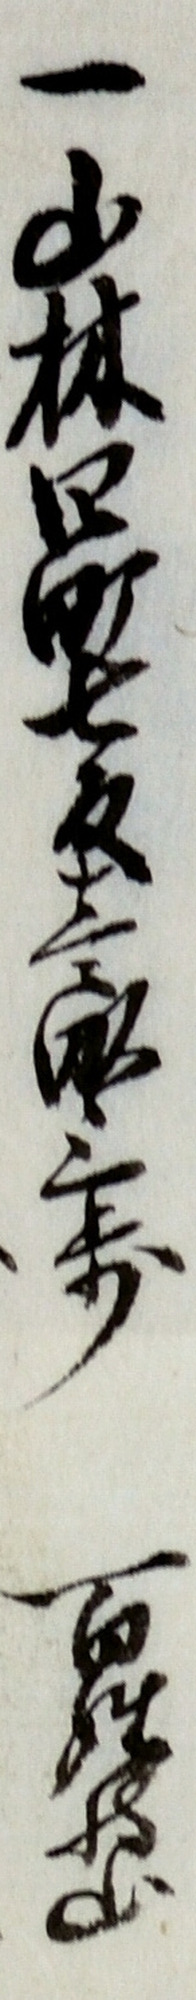一山林四町七反壱畝三歩百姓持山
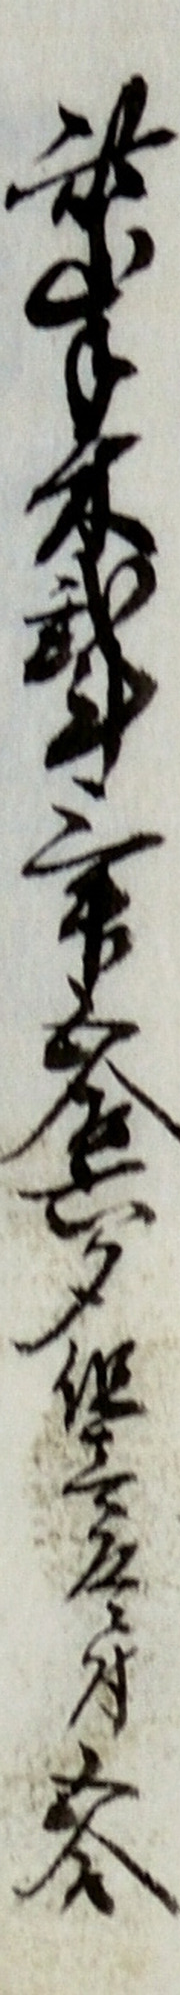此山手米弐斗三升五合六夕但壱反ニ付五合
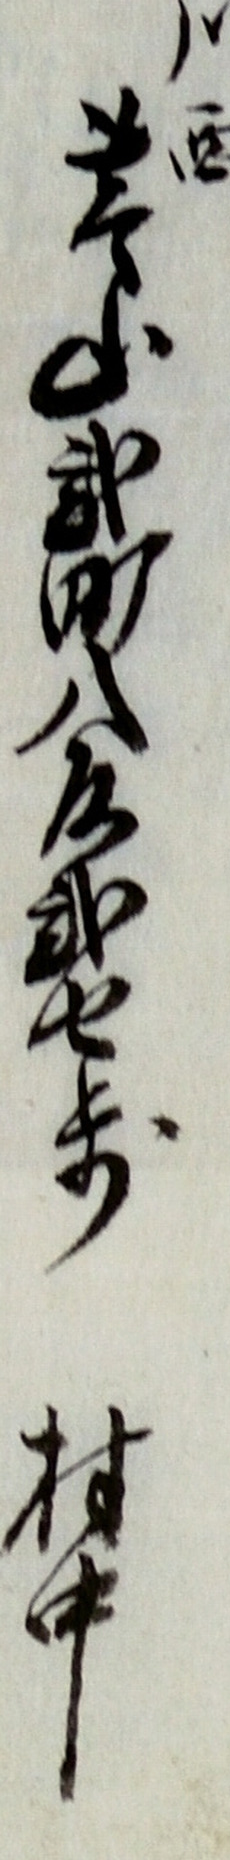芝山弐町八反弐セ歩村中

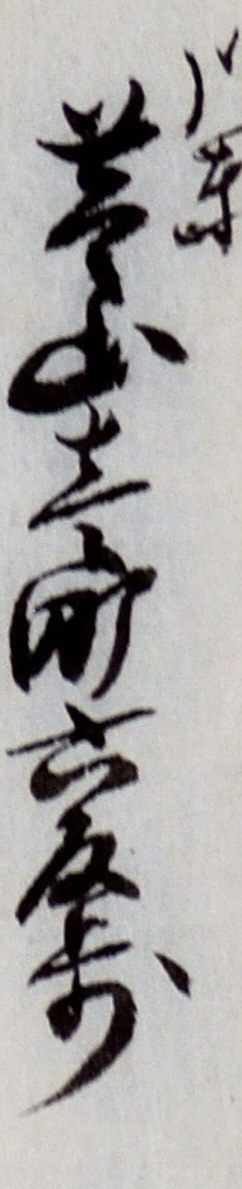芝山壱町六反歩村中
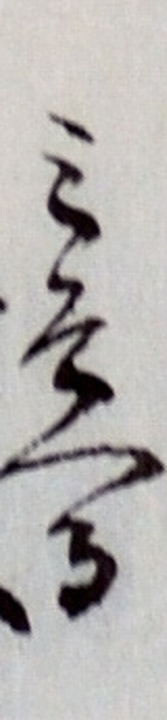みそつる
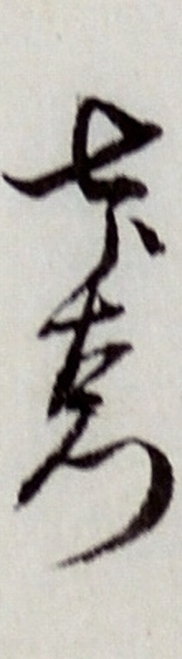四郎右衛門
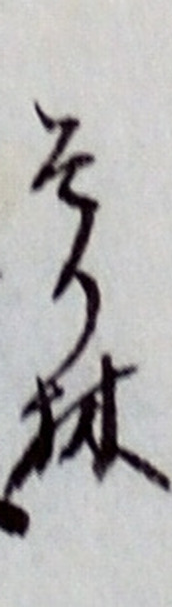そり林
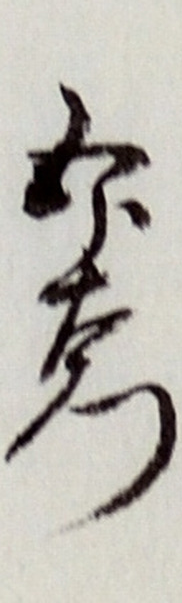四郎右衛門
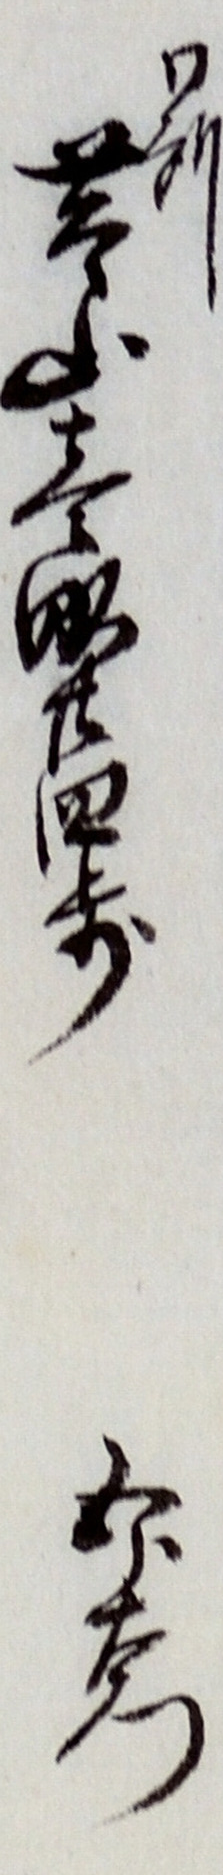芝山壱畝廿四歩五郎右衛門
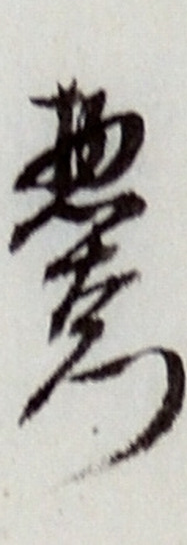源右衛門
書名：御領分中山林社地手控
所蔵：伊那市立高遠町図書館・合同会社AMANE
